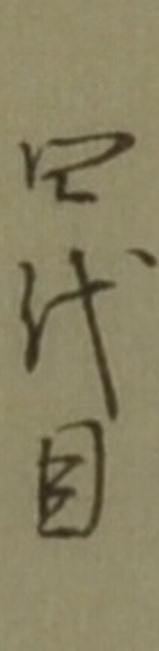四代目
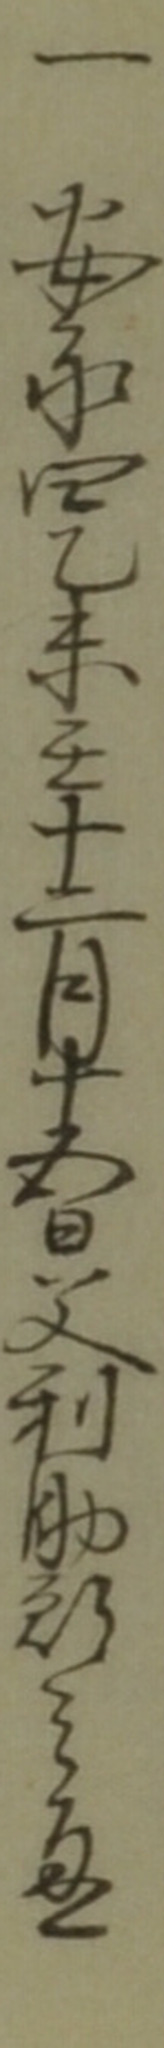一安永四乙未閏十二月十五日父利助願之通
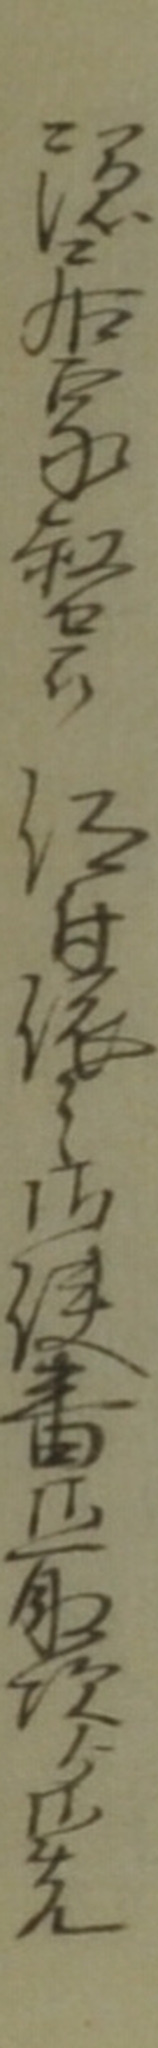隠居家督被仰付依之御使番御取次ゟ御先
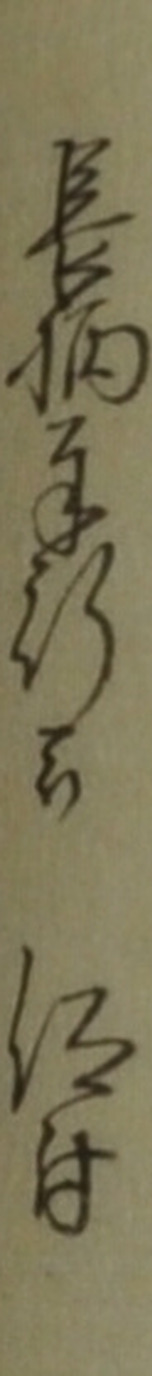御先長柄奉行被仰付
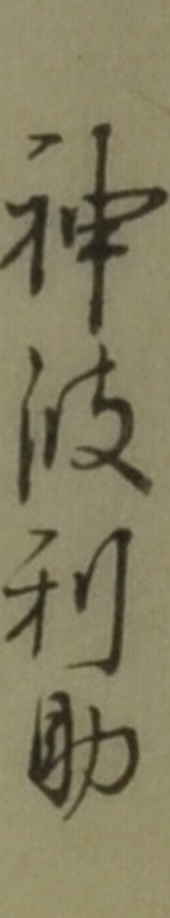神波利助
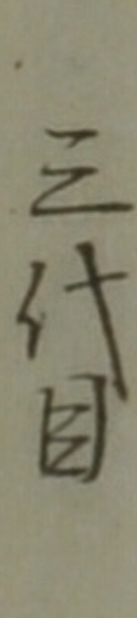三代目
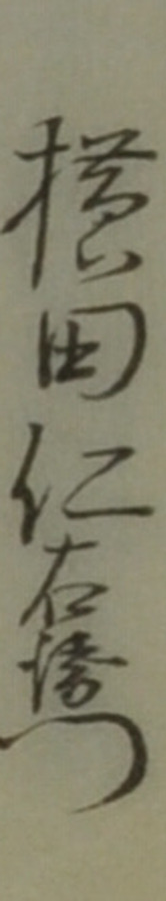横田仁右衛門
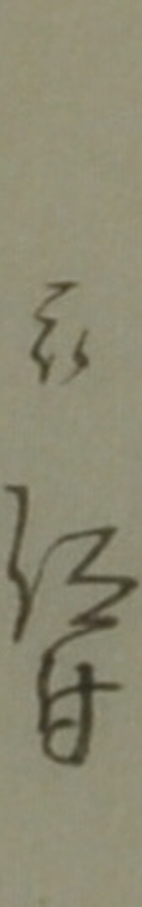被仰付
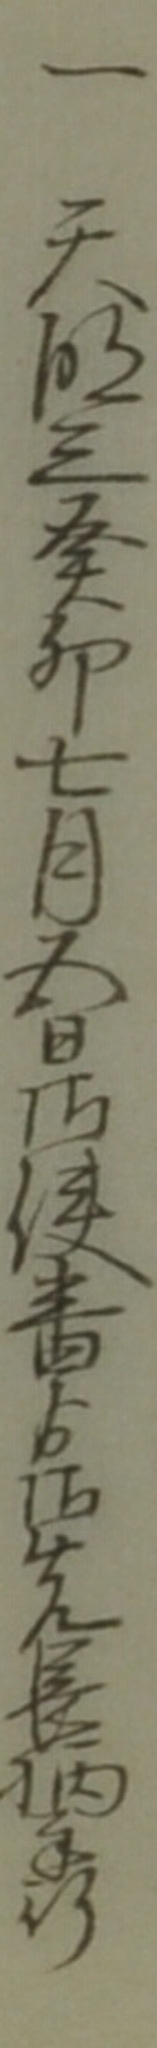一天明三癸卯七月五日御使番ゟ御先長柄奉行
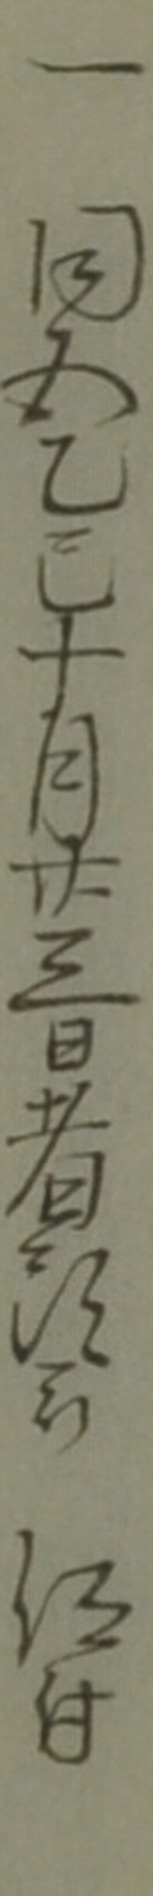一同五乙巳十月廿三日者頭被仰付
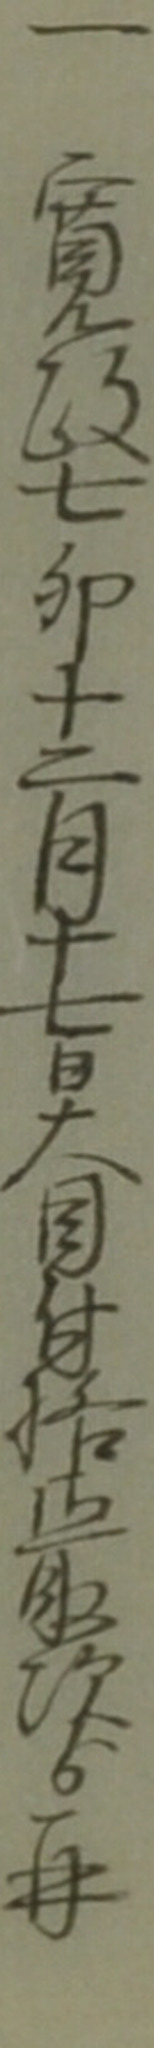一寛政七卯十二月十七日大目付格御取次ゟ再
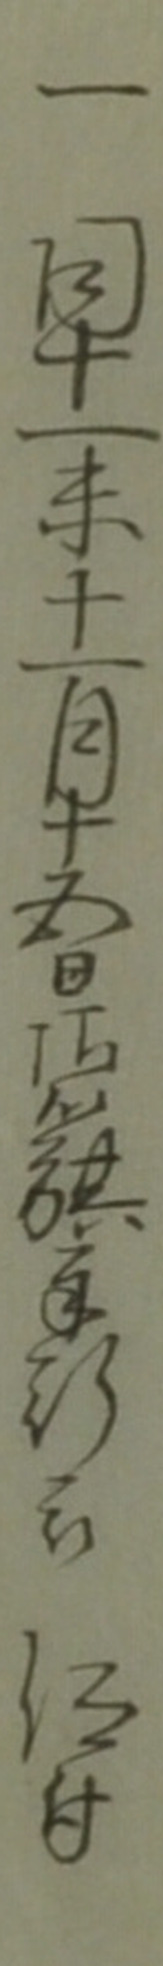一同十一未十一月十五日御旗奉行被仰付
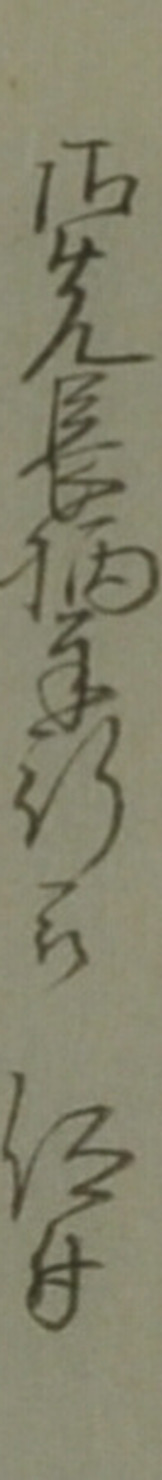御先長柄奉行被仰付
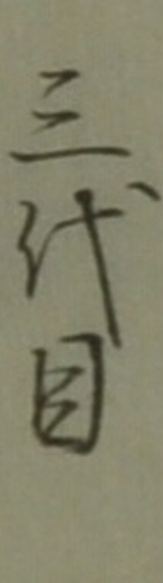三代目
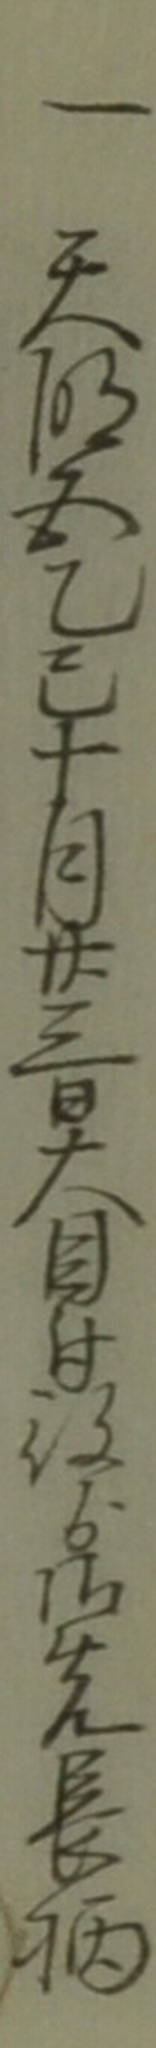一天明五乙巳十月廿三日大目付役ゟ御先長柄
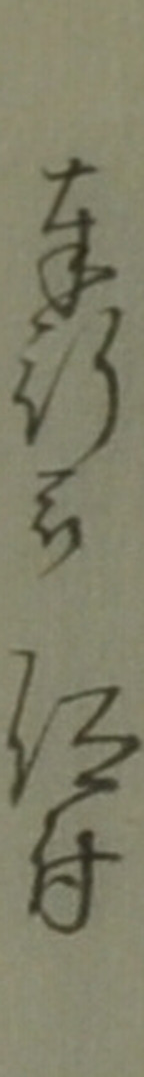奉行被仰付
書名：諸御役代々録（三）
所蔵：伊那市立高遠町図書館・合同会社AMANE
